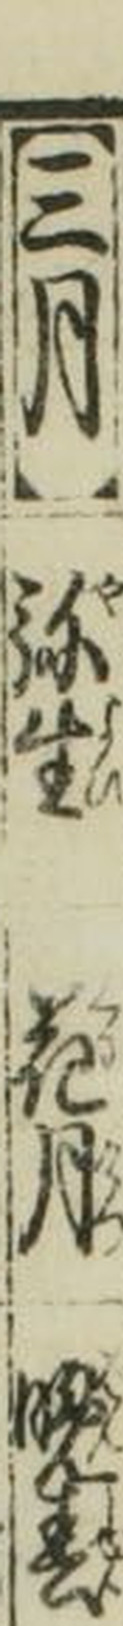三月弥生花月晩春
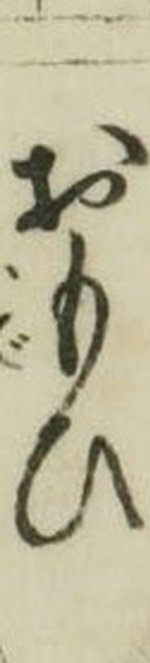おもひ
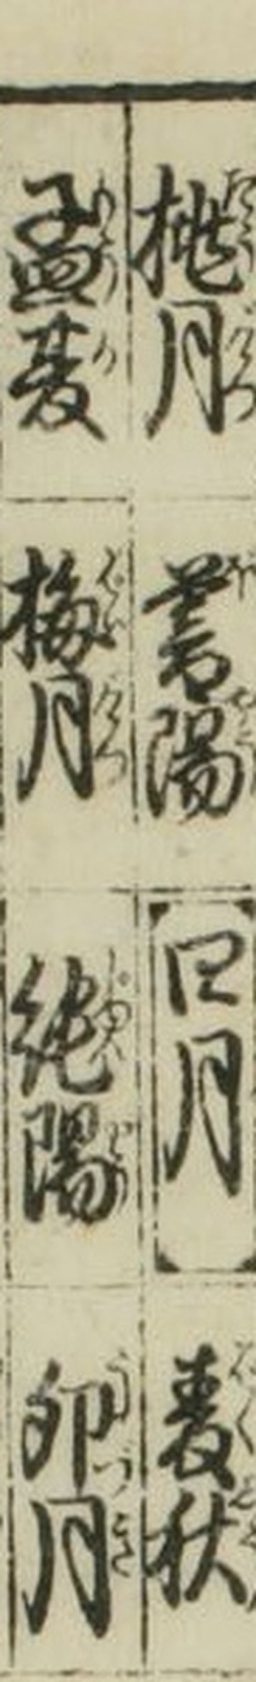孟夏梅月純陽卯月
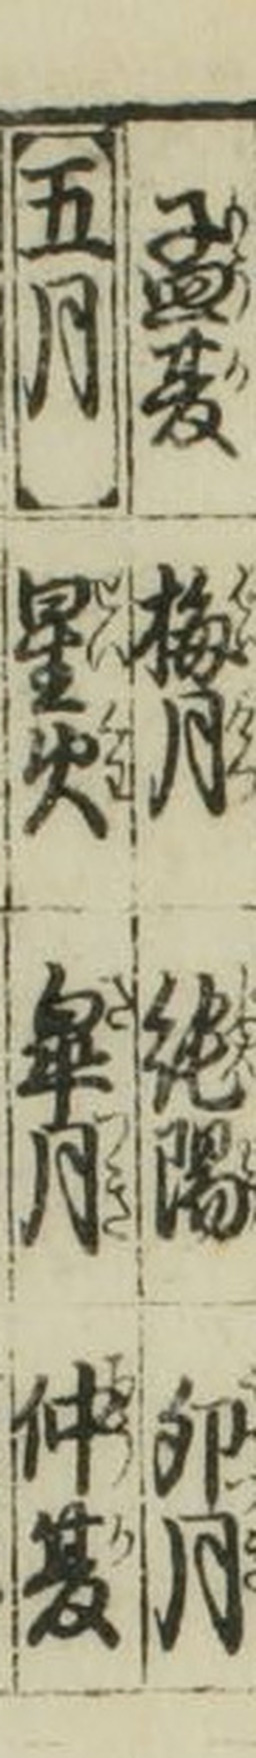五月星火皐月仲夏
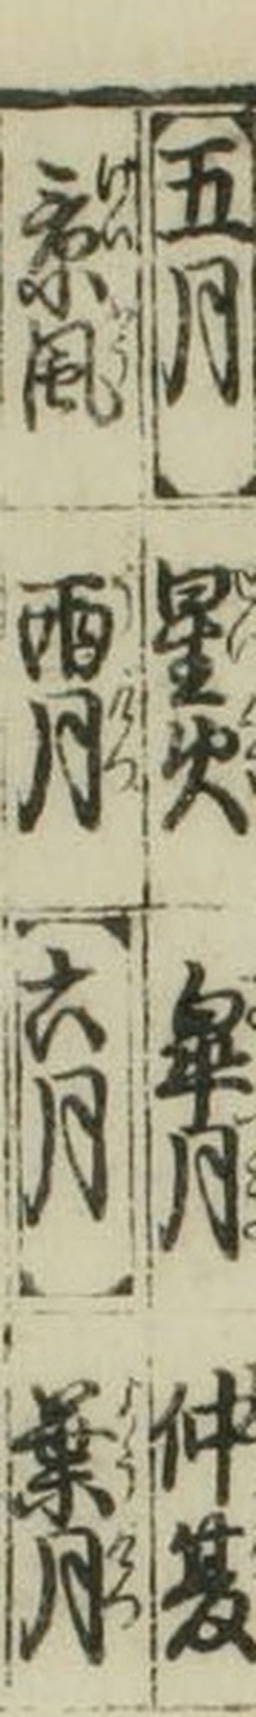景風雨月六月葉月
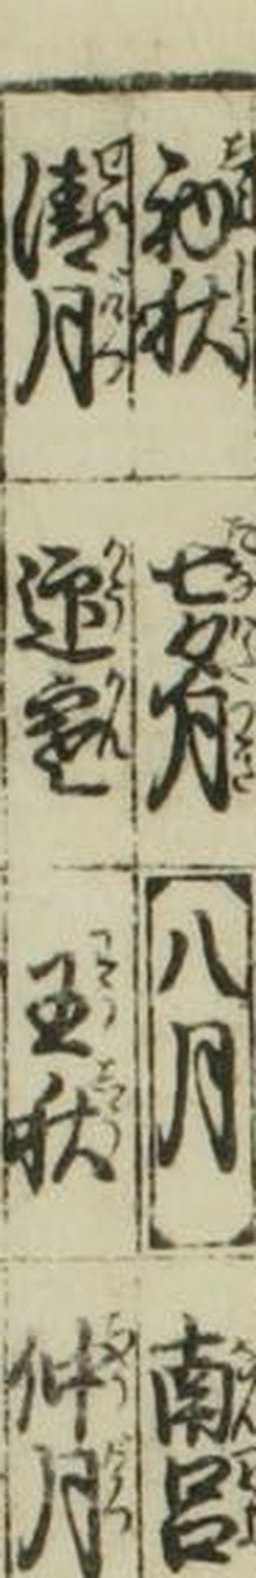清月迎寒王秋仲月
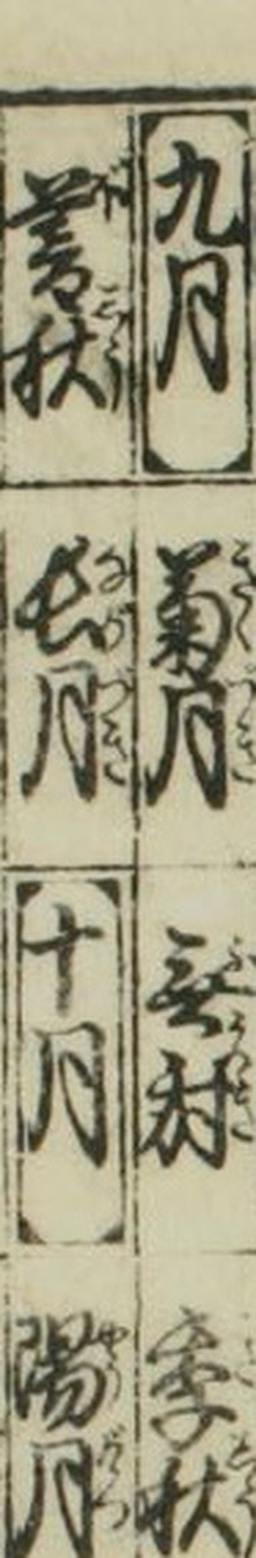暮秋長月十月陽月
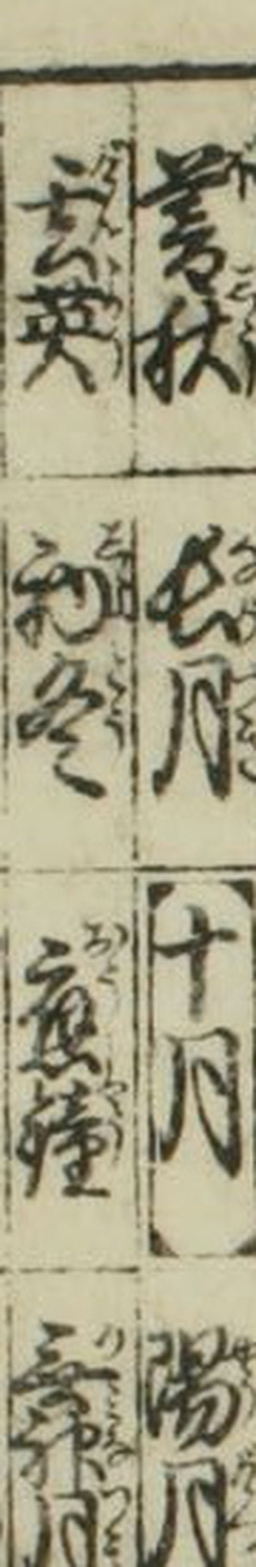玄英初冬応鐘神無月
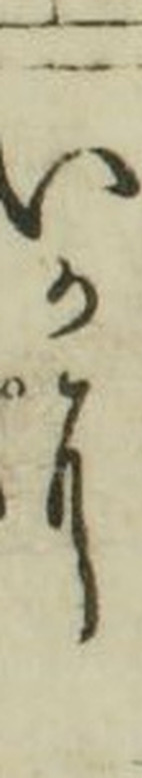いかに
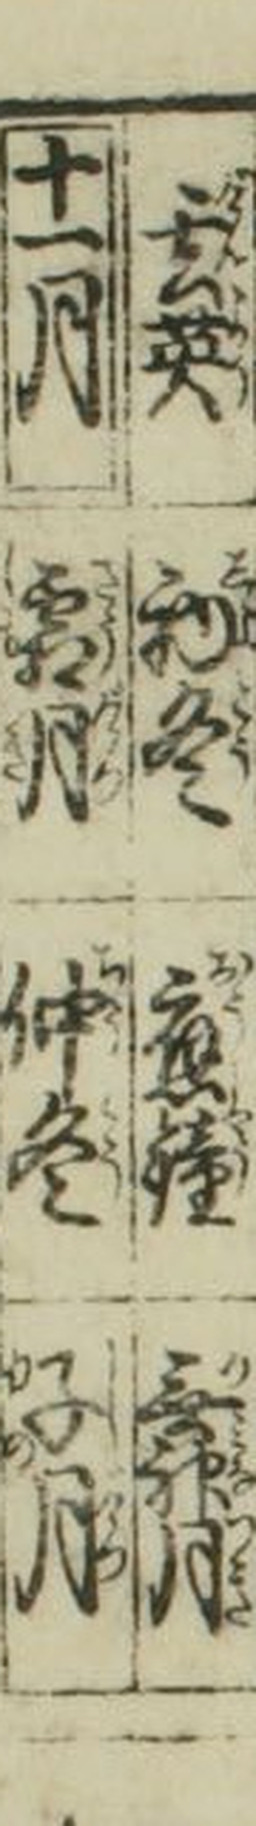十一月霜月仲冬子月
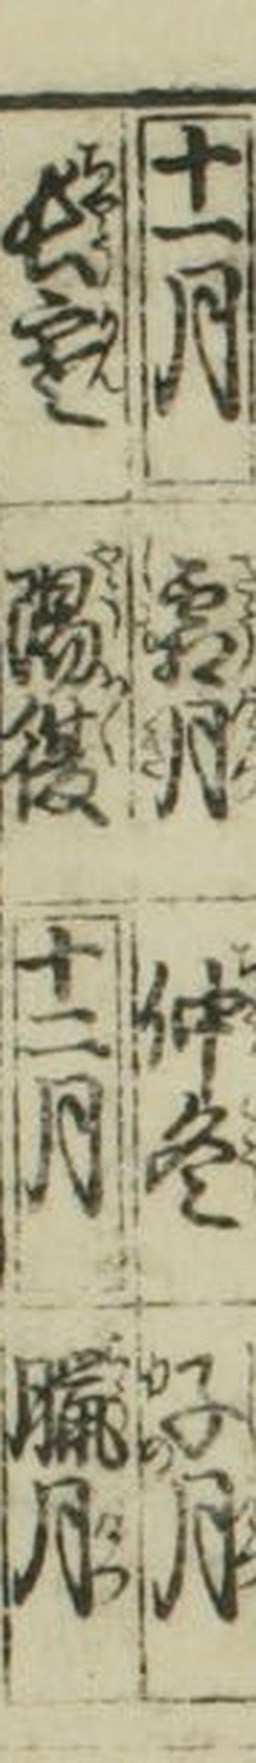長寒陽復十二月臘月
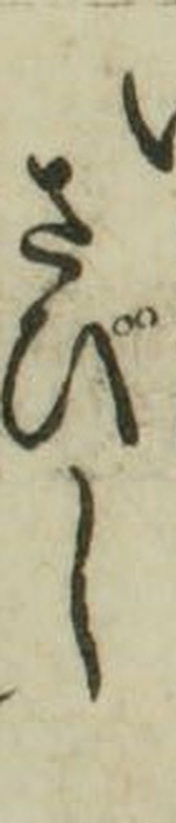さびし
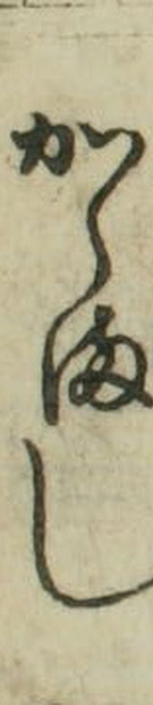からまし

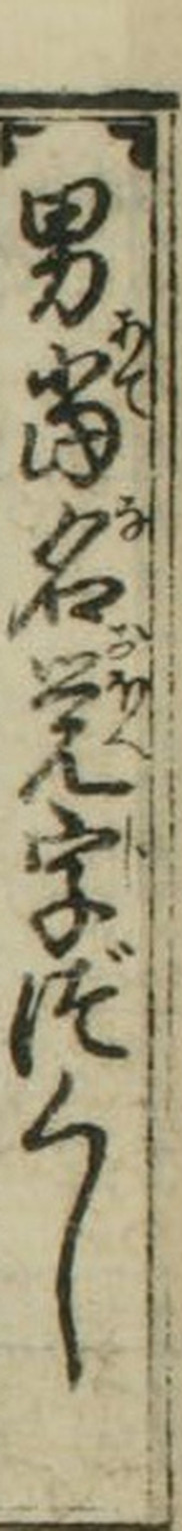男当名覚字づくし
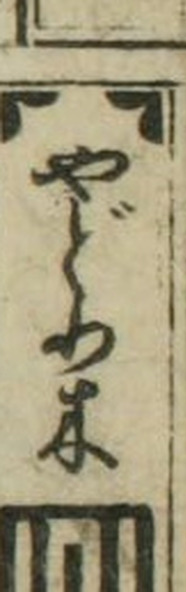やどり木
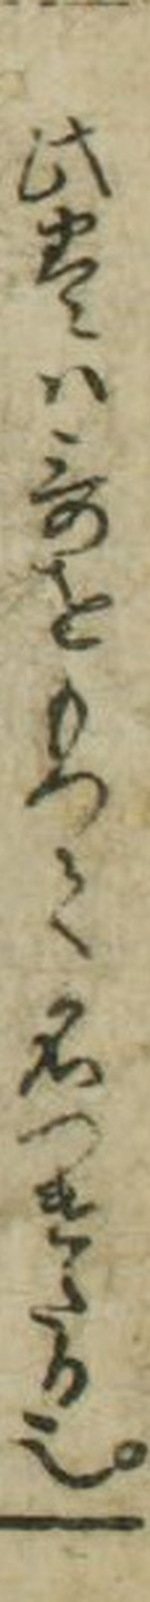此巻は哥をもつて名つけたる也。
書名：女源氏教訓鑑
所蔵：東京学芸大学附属図書館
